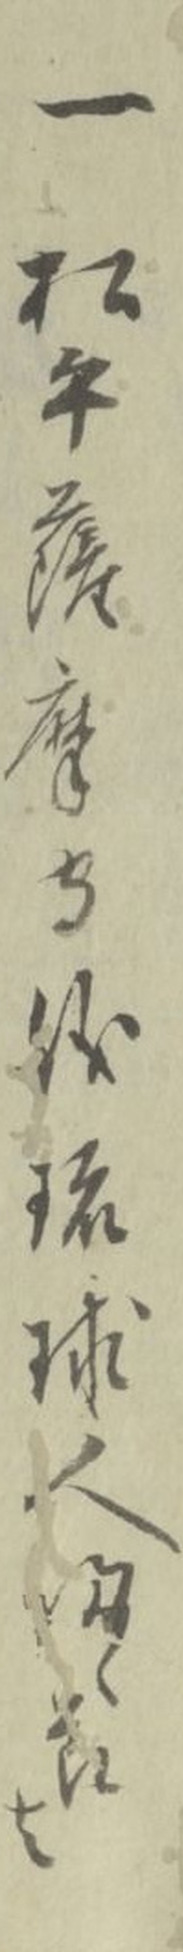一松平薩摩守儀琉球人帰之節は
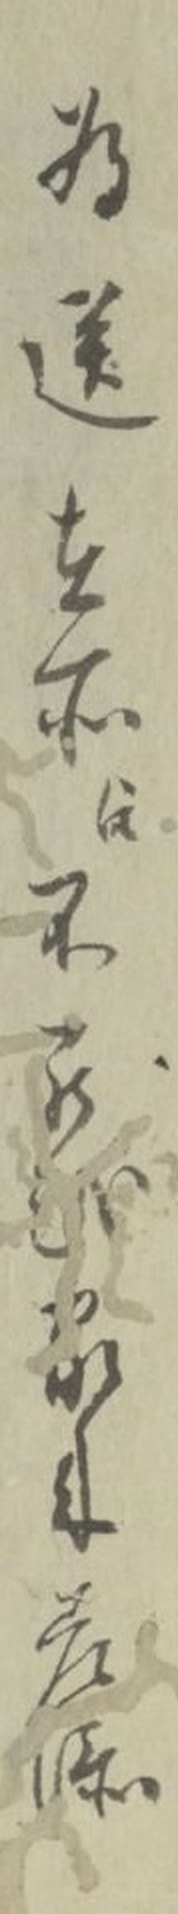為送在所え不罷越家来差添
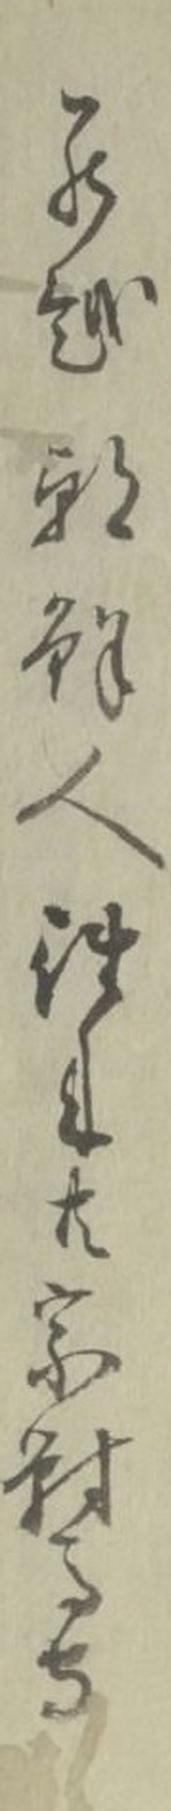罷越朝鮮人往来共宗対馬守

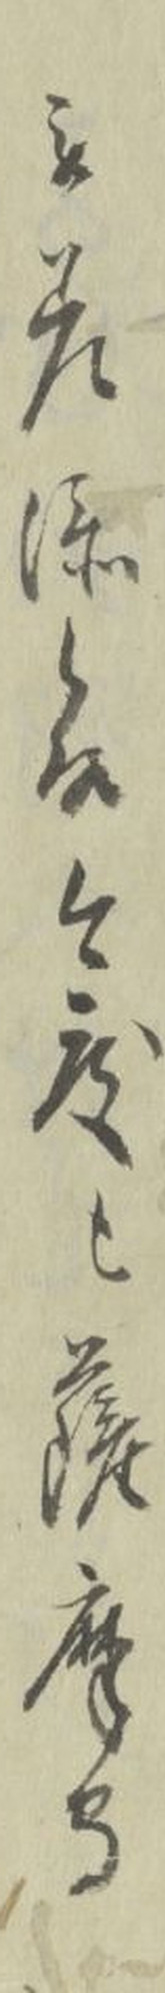被差添候様今度も薩摩守
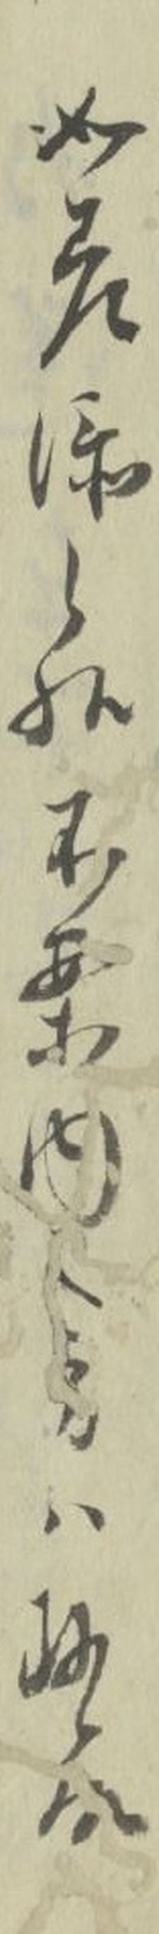如差添候様不案内之旨は聊候様
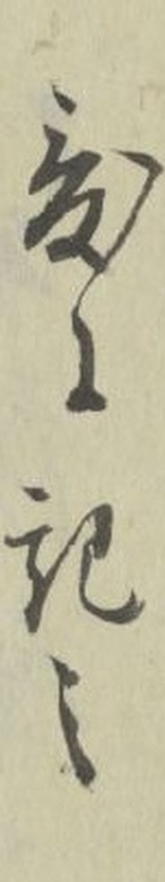爰に記之
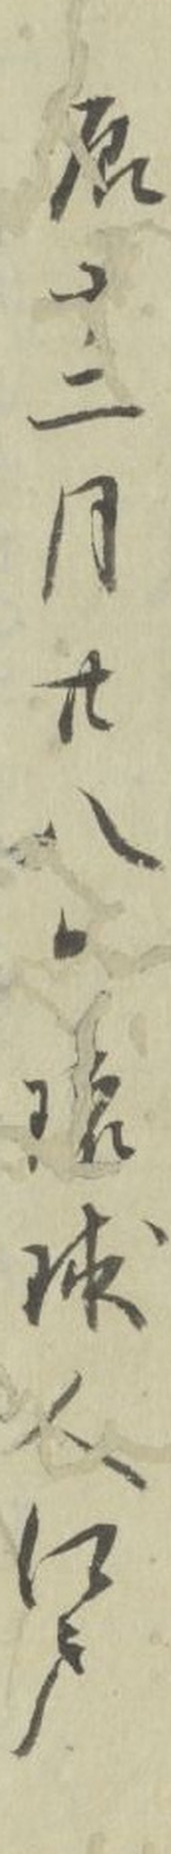一辰十二月廿八日琉球人江戸
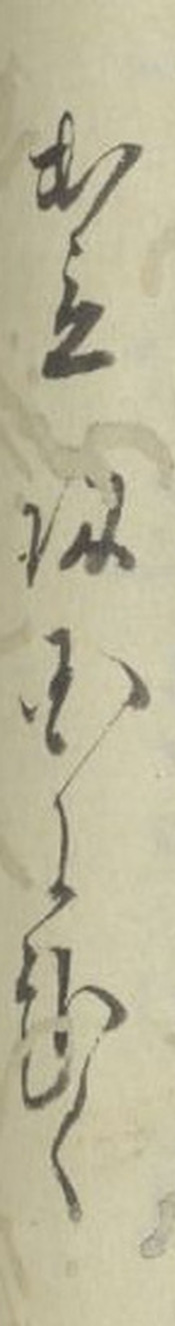出立帰国に赴候
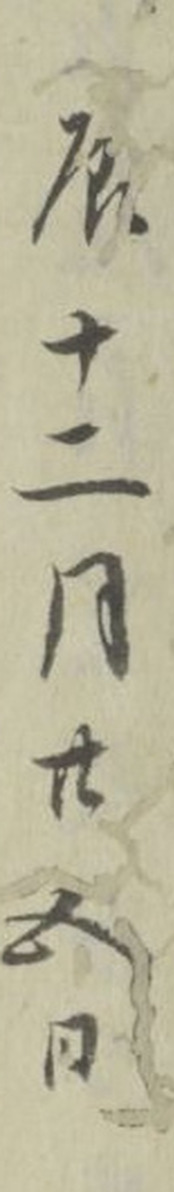辰十二月廿五日
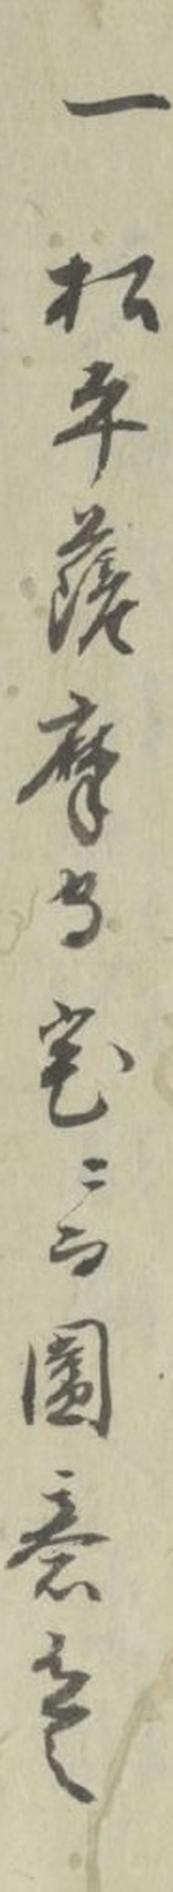一松平薩摩守宅に而囲碁有之
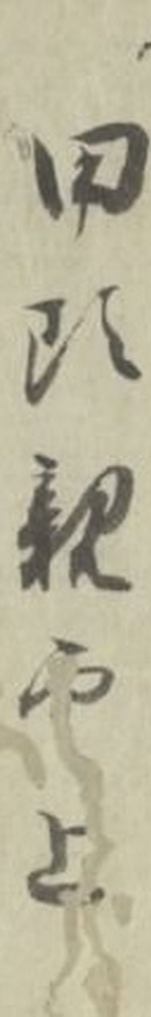田頭親雲上
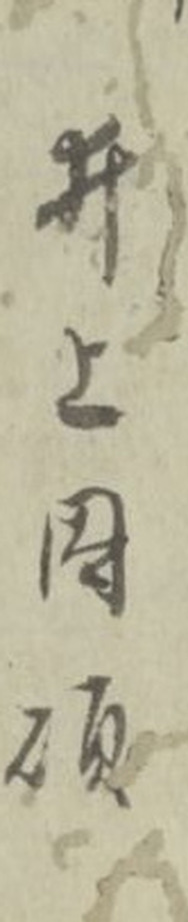井上因硯
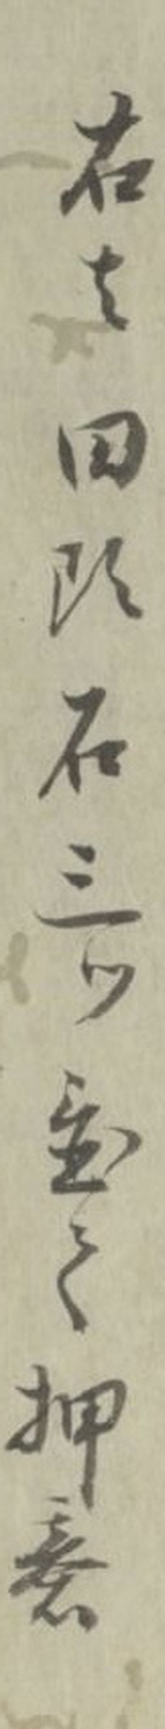右は田頭石三ツ置て押碁

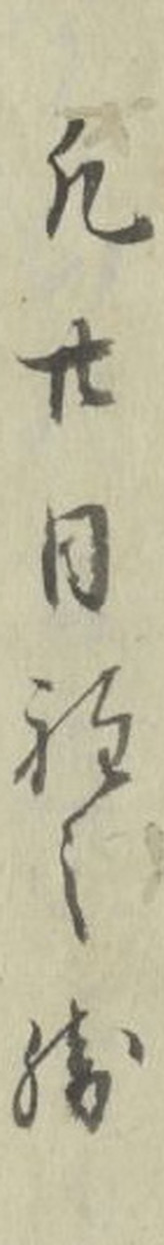凡廿目程之勝
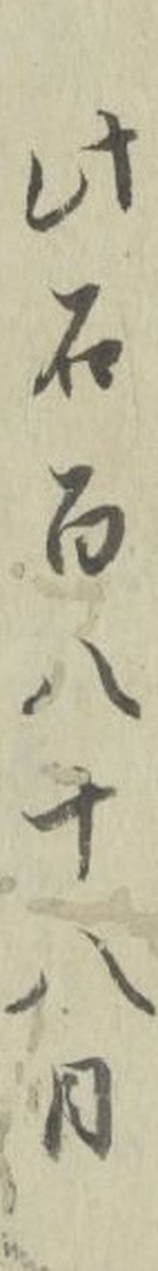此石百八十八目
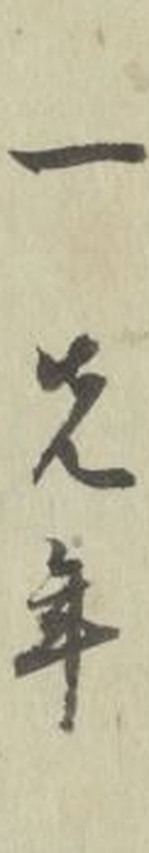一先年
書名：琉球来朝記 自八至十四終
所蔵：University of the Ryukyus Library
